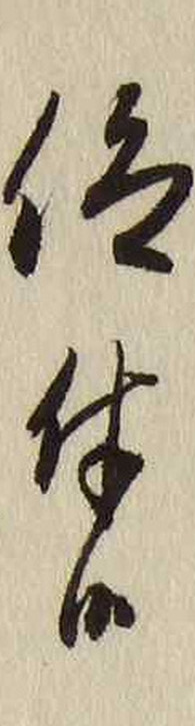仰付候
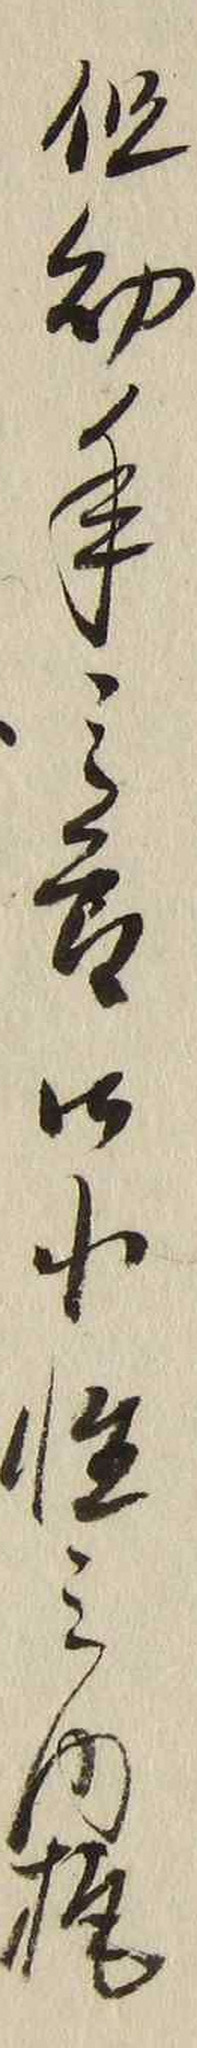但幼年之節御小性之内梶
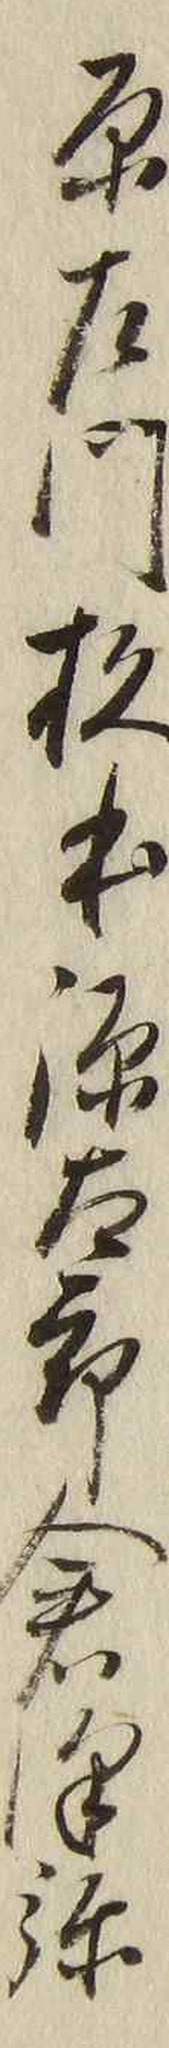原左門杉本源太郎倉沢弥

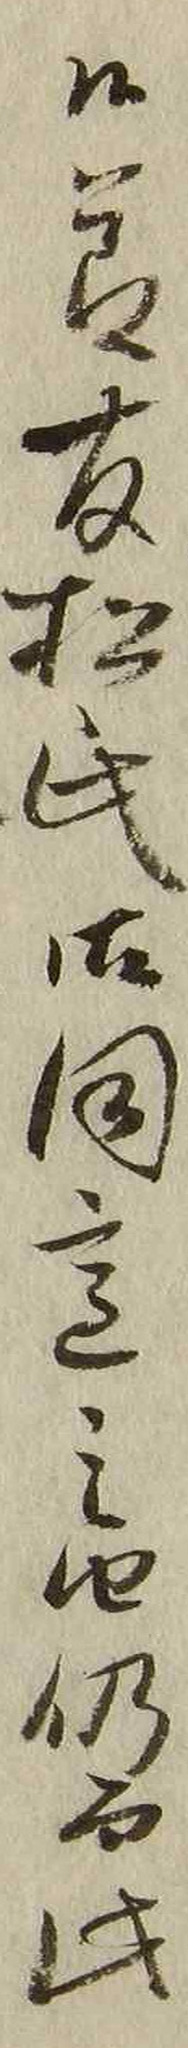候節藤松氏御同意之由仍而此
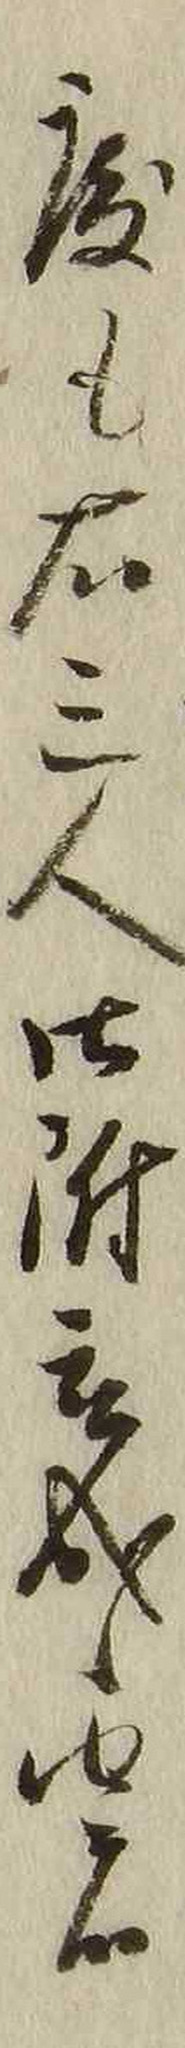度も右三人御附被成候由ニ候
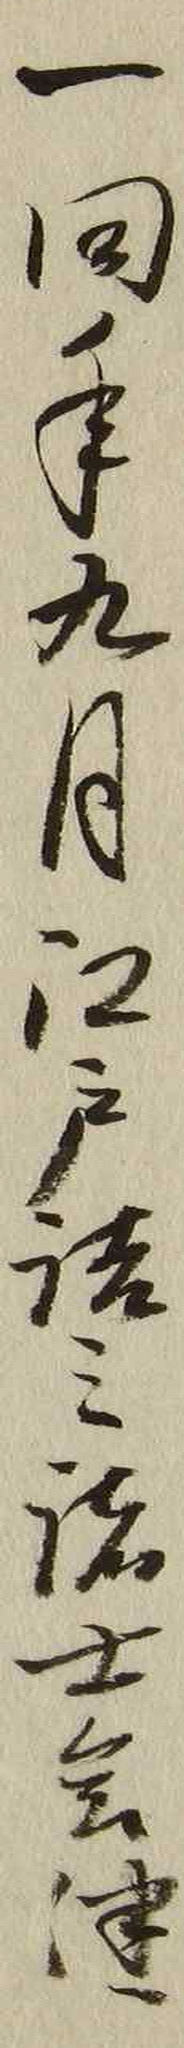一同年九月江戸詰之諸士会へ
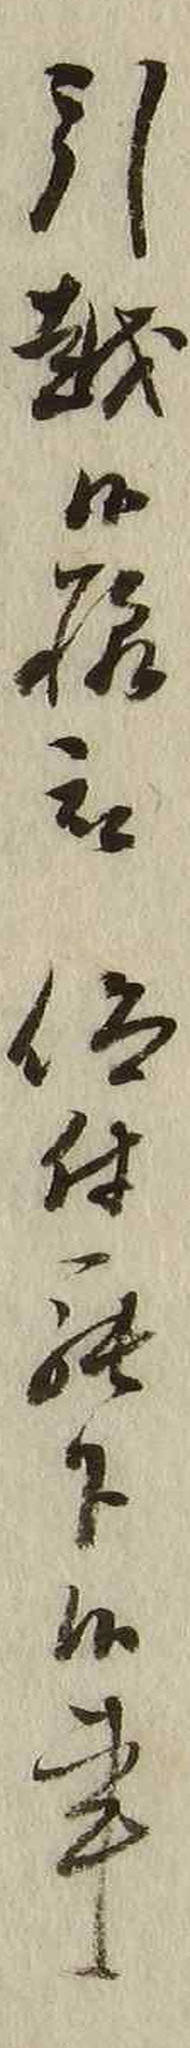引越候様被仰付罷下候事
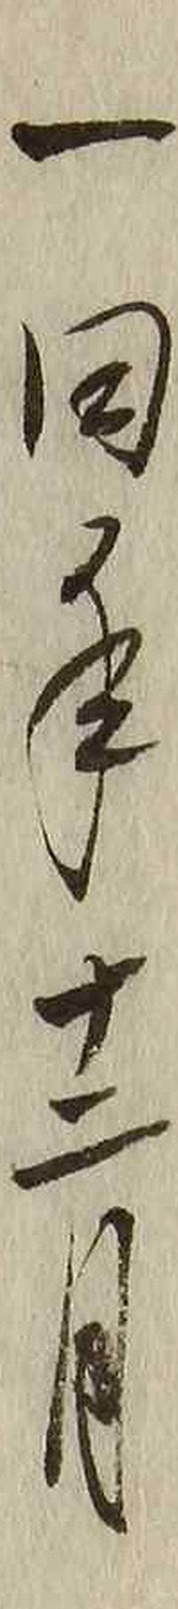一同年十二月
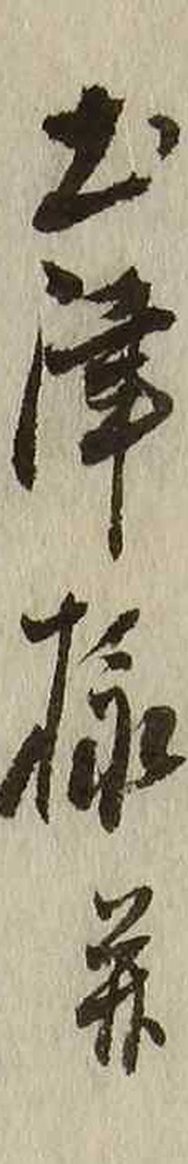土津様并
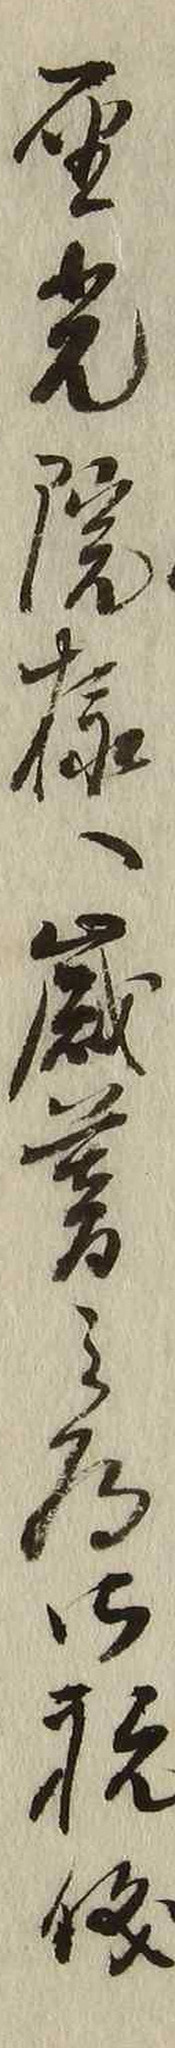聖光院様へ歳暮之為御祝儀
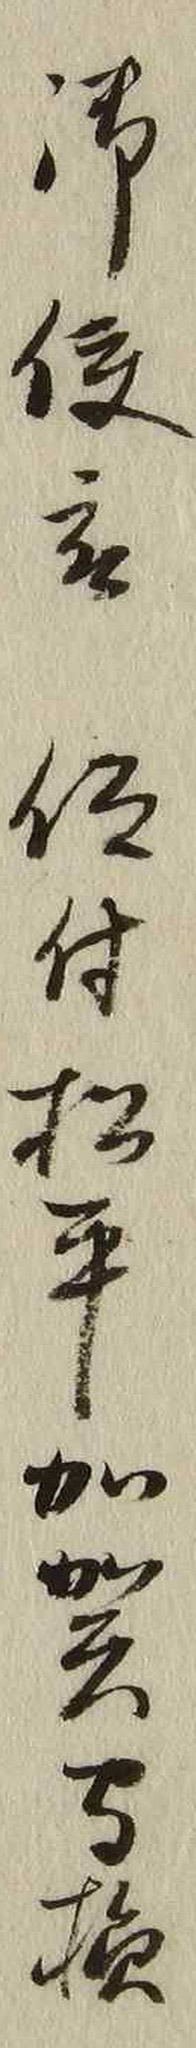御使被仰付松平加賀守様
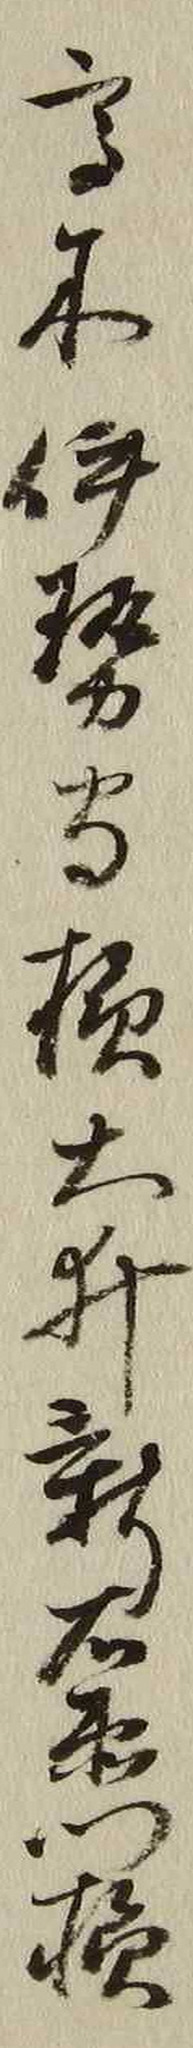高木伊勢守様大井新右衛門様
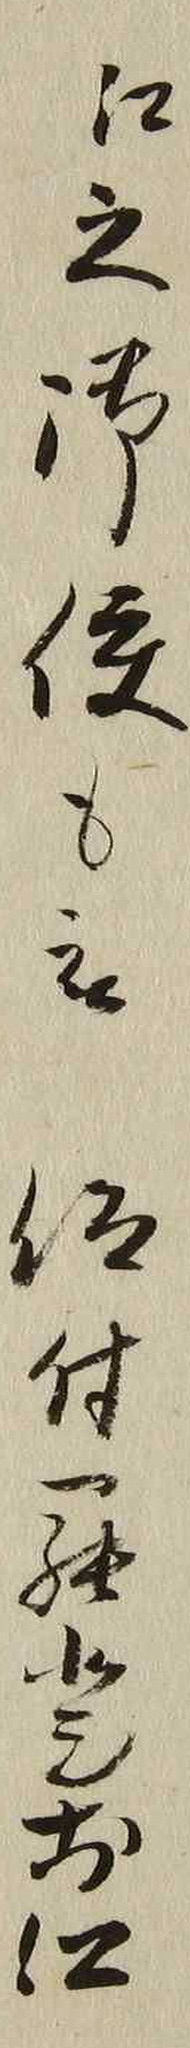江之御使も被仰付罷登於江
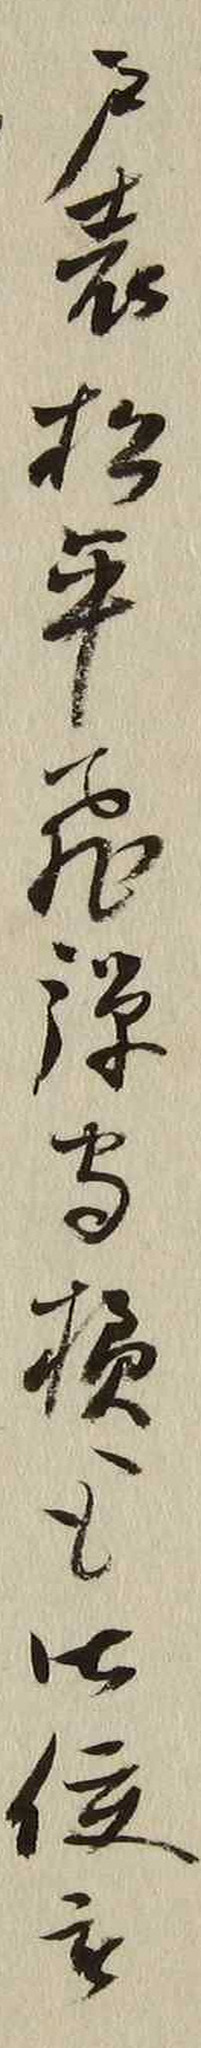戸表松平飛騨守様へも御使被
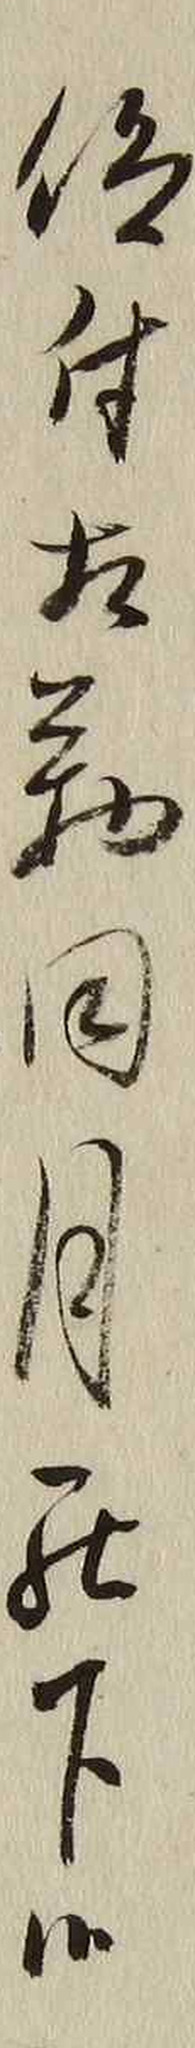仰付相勤同月罷下候
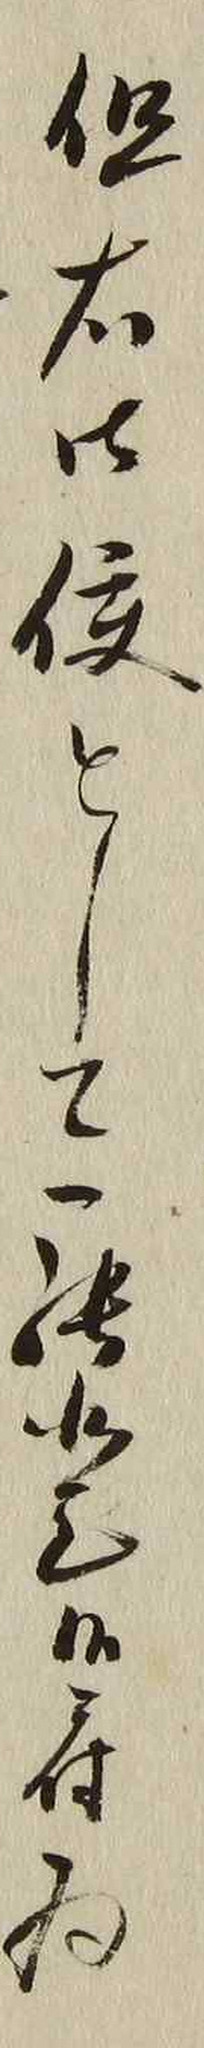但右御使として罷登候ニ付為
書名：諸士系譜　巻之355　す之部5
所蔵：会津若松市立会津図書館
